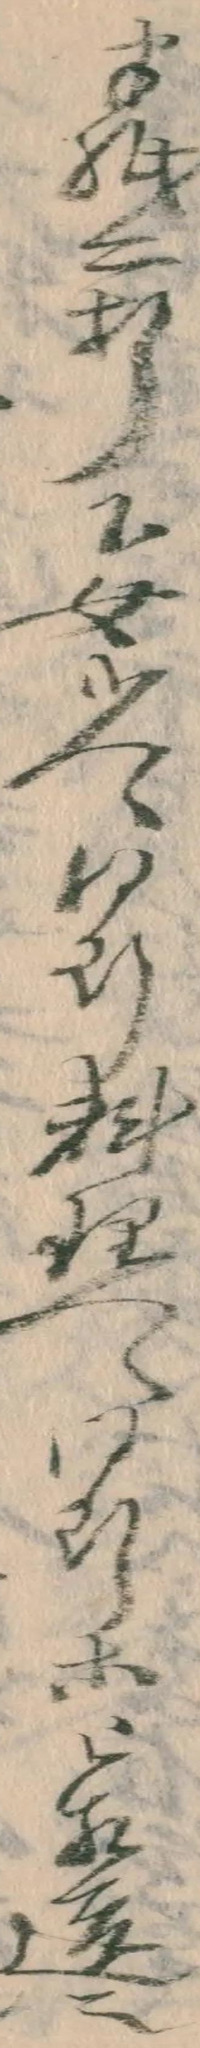半紙二折下女弐人へ同断料理人へ同断等被相送也
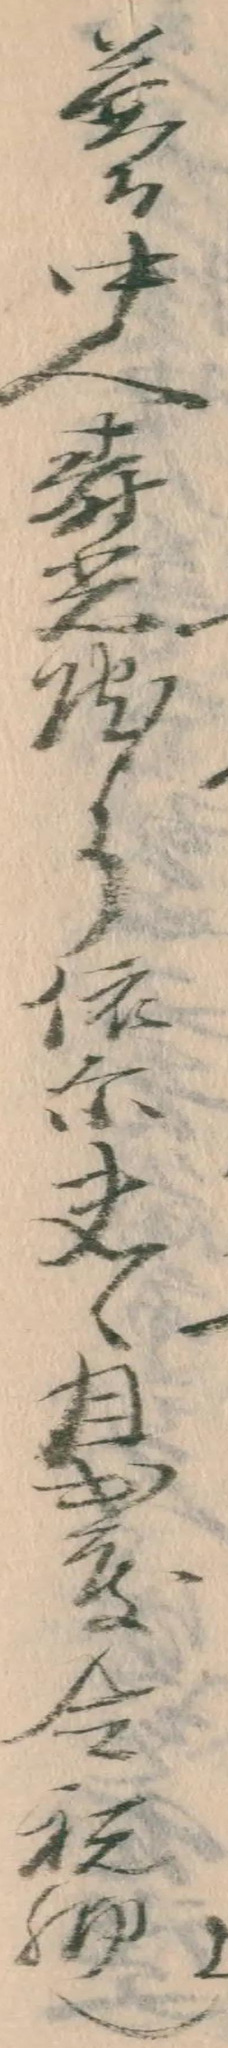兼而中人壽光院より依尓夫々目出度令祝納也
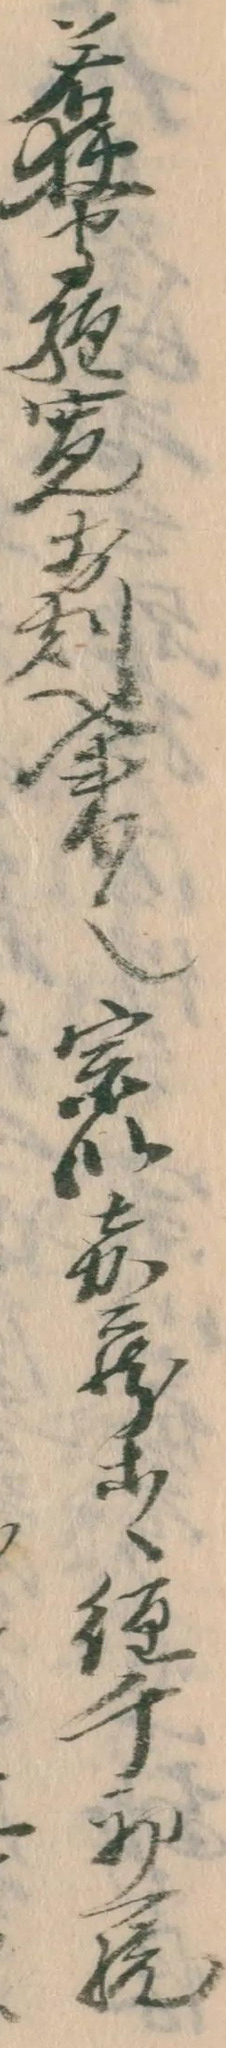若狭守経寛前刻入来也宗以嘉蔵等へ経千初一統
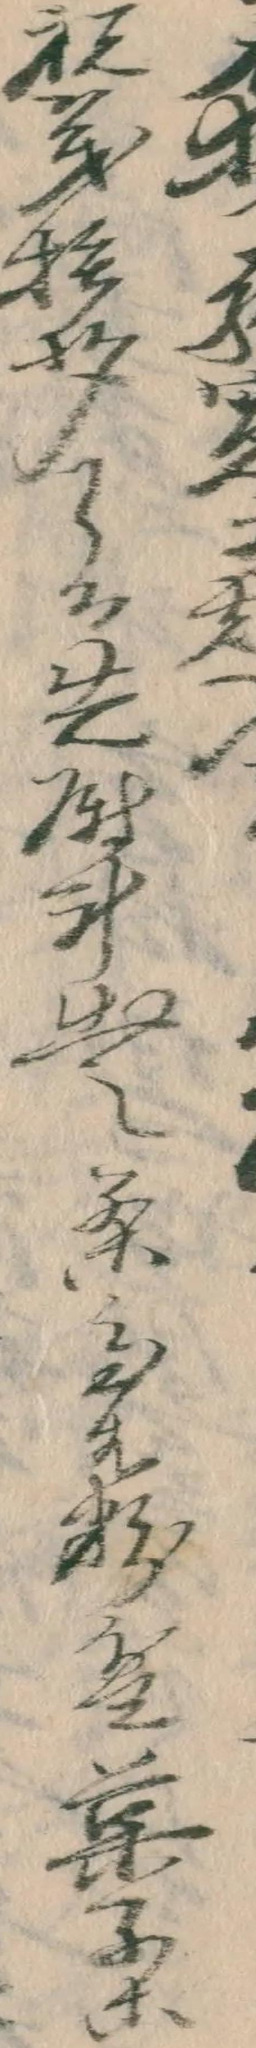祝義挨拶了而御先熨斗出之茶たは粉盆菓子等
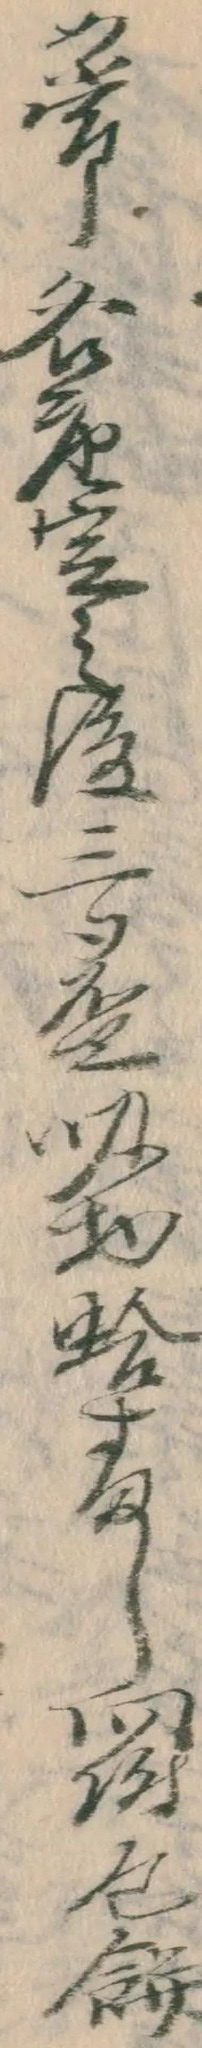如常各座定之後三ッ盃吸物蛤すまし向附包餅
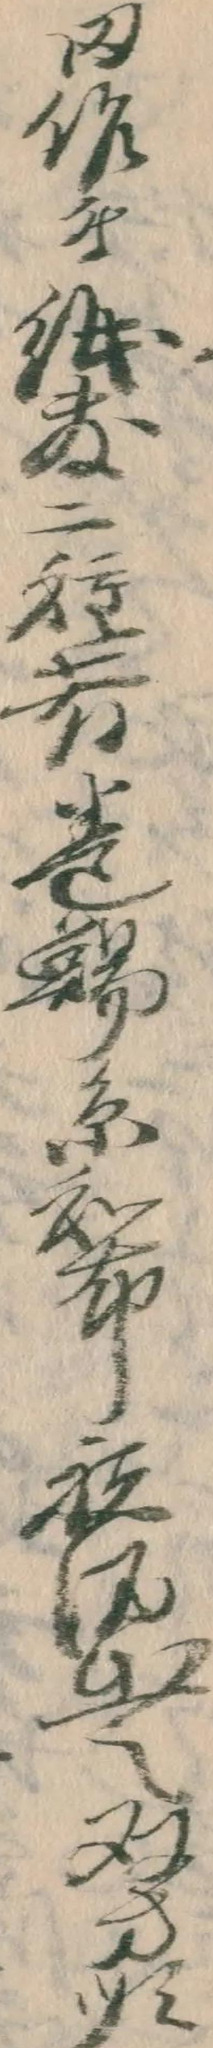田作付紙敷二種背巻鯣糸和布祝酒出之双方順
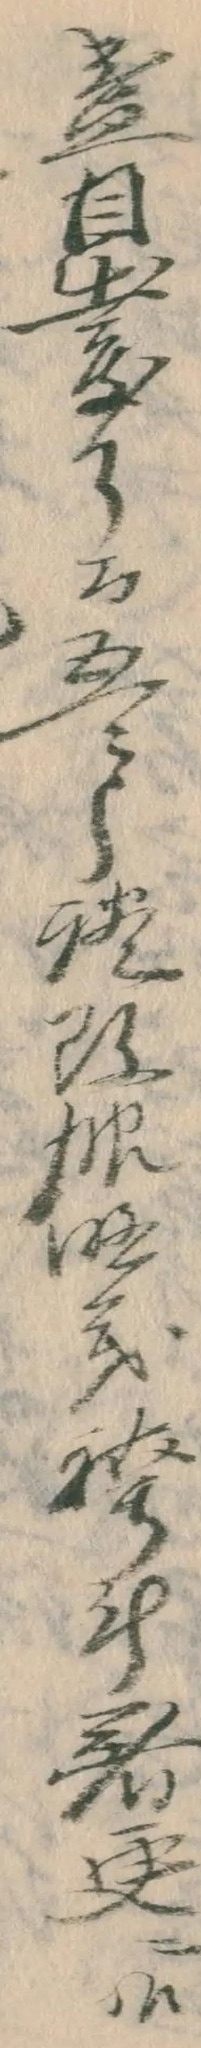盞目出度了而互ニ申談改服略義袴斗着更ニは
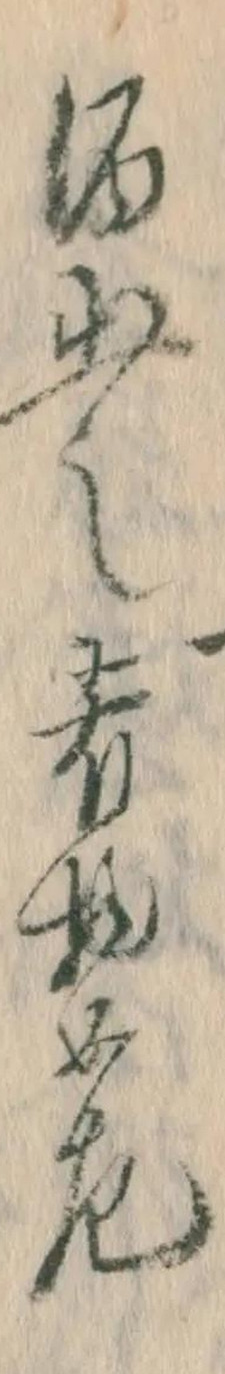酒出也肴物如左

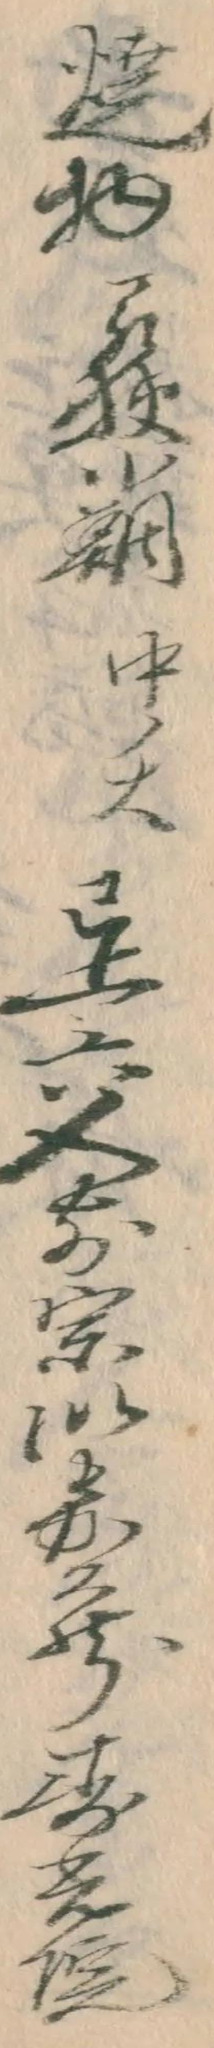焼物若狭小鯛中ノ大已上六人前宗以嘉蔵壽光院
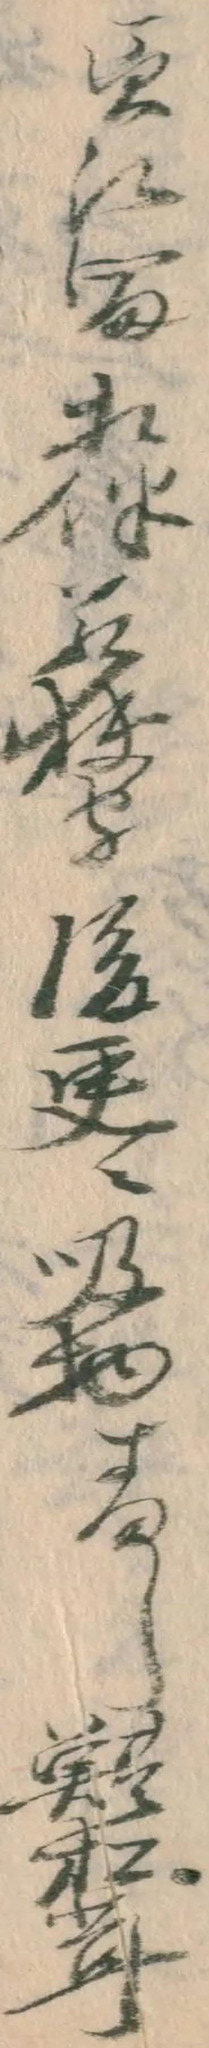美江冨相伴若狭守後更ニ吸物すまし鯵松茸
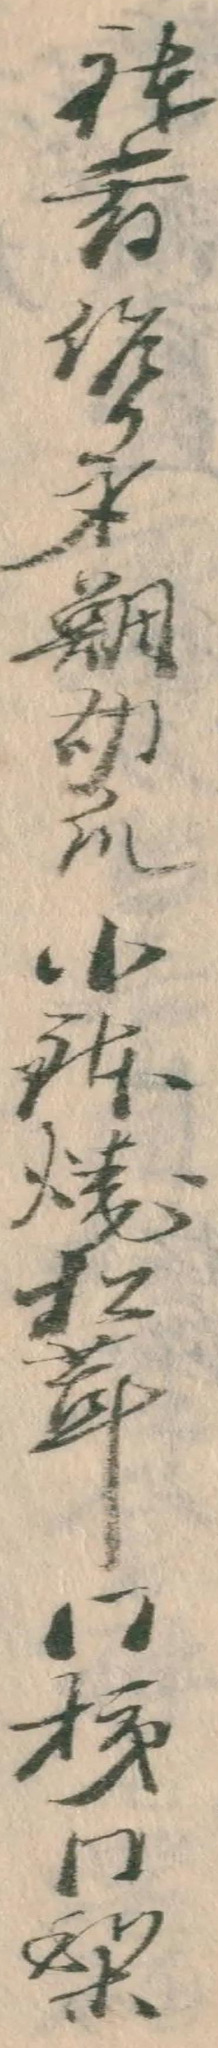鉢肴作り身鯛胡瓜小鉢焼松茸同柿同梨
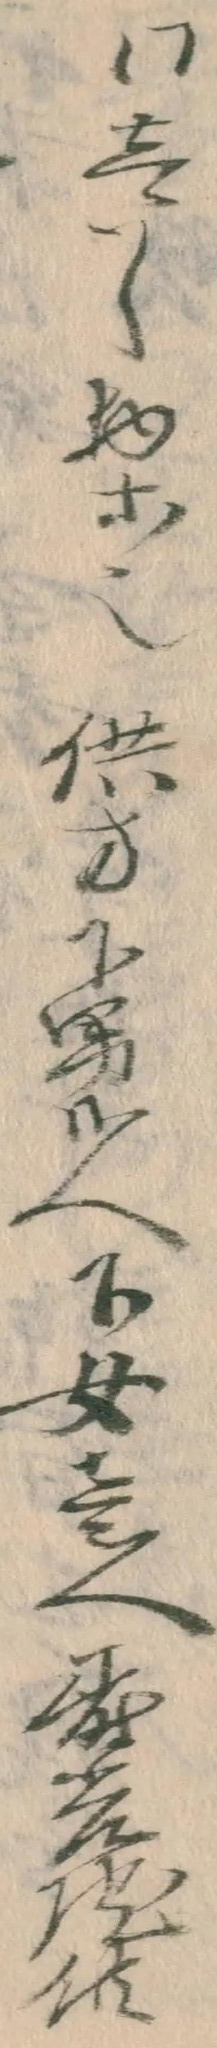同ひたし物等也供方下男弐人下女壱人壽光院供
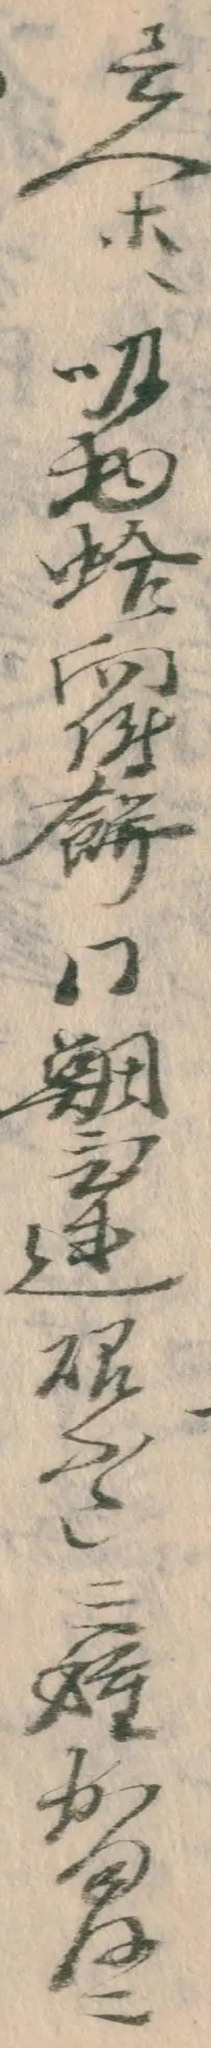壱人等へ吸物蛤向附餅同鯛ひれ根ふた二種かまほこ
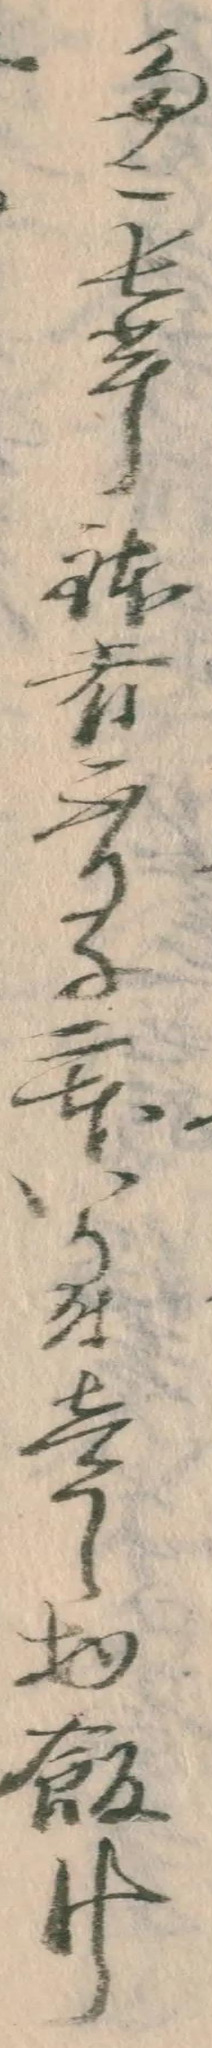たこ長芋鉢肴ふりに二本いり付ひたし物飯汁
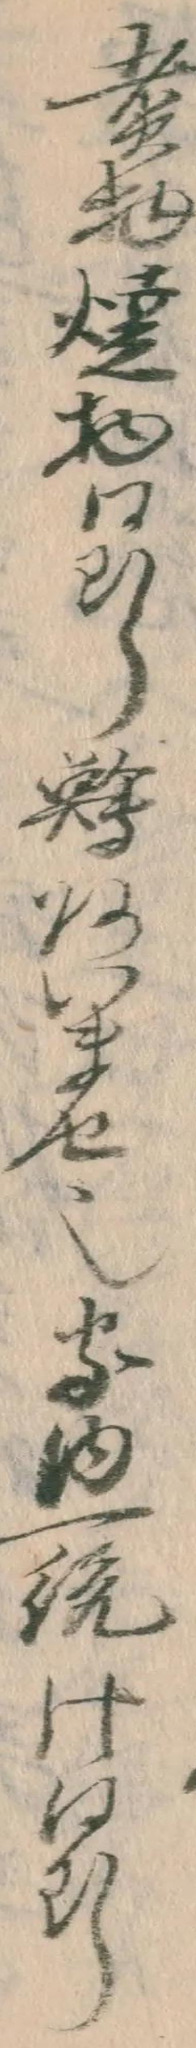煮物焼物同断鱠あいませ也家内一統汁同断
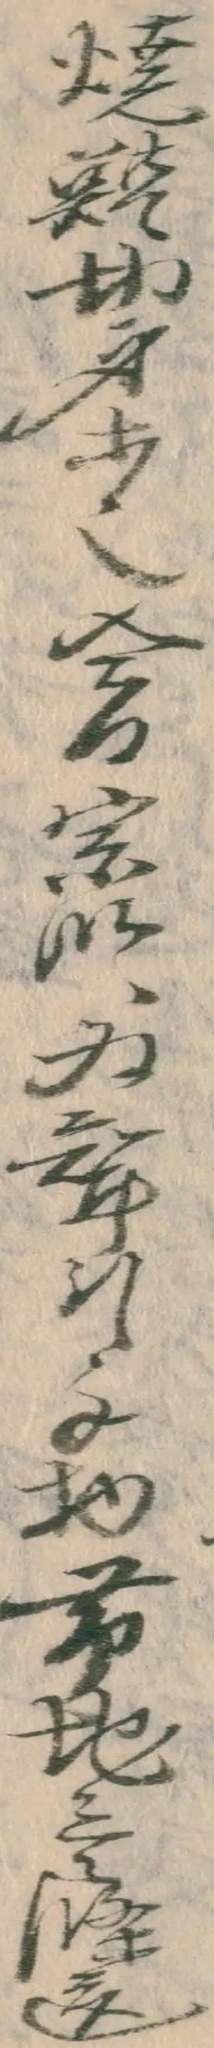焼鯵切身等也今日宗以へ為聟引手物帯地壱條送
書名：賀茂社記録. 第67冊
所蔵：国立国会図書館 National Diet Library, JAPAN
